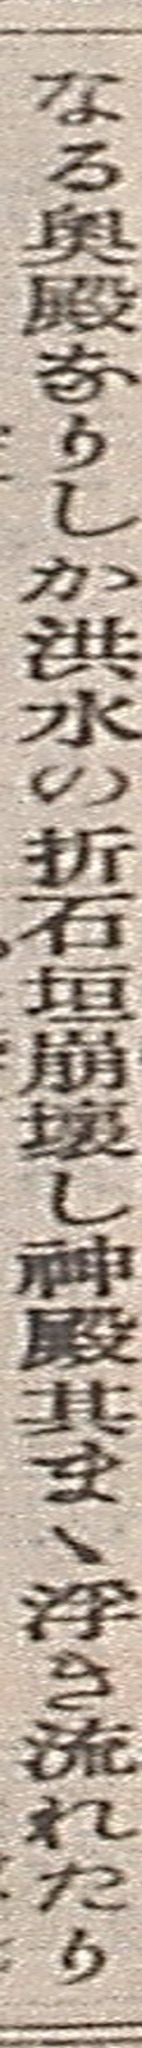なる奥殿なりしか洪水の折石垣崩壊し神社其まゝ浮き流れたり
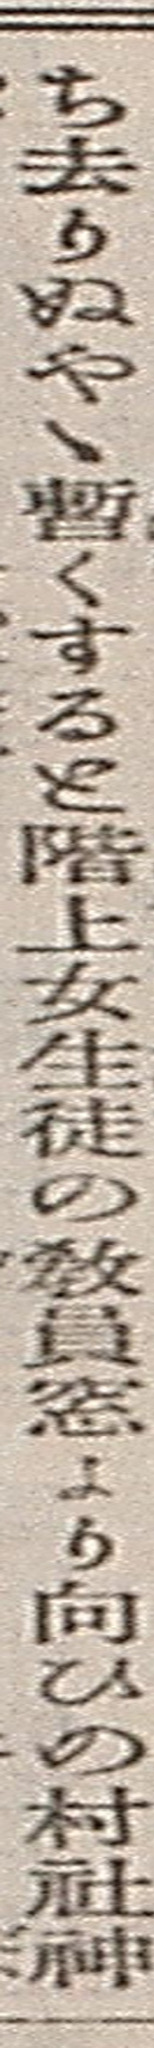ち去りぬやゝ暫くすると階上女生徒の教員窓より向ひの村社神
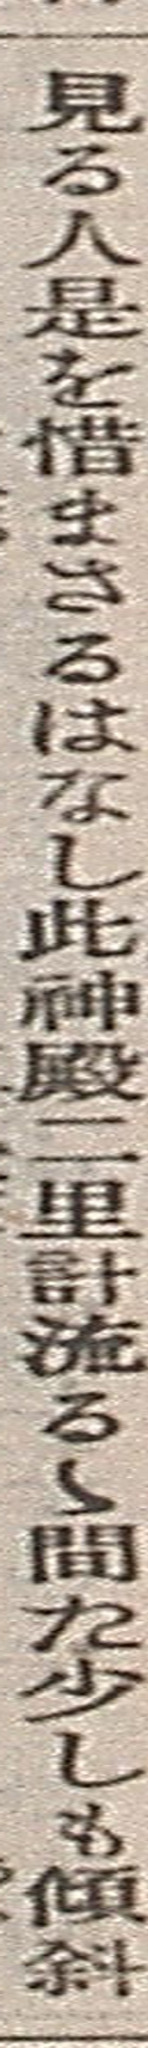見る人是を惜まさるはなし此神殿二里計流るゝ間た少しも傾斜
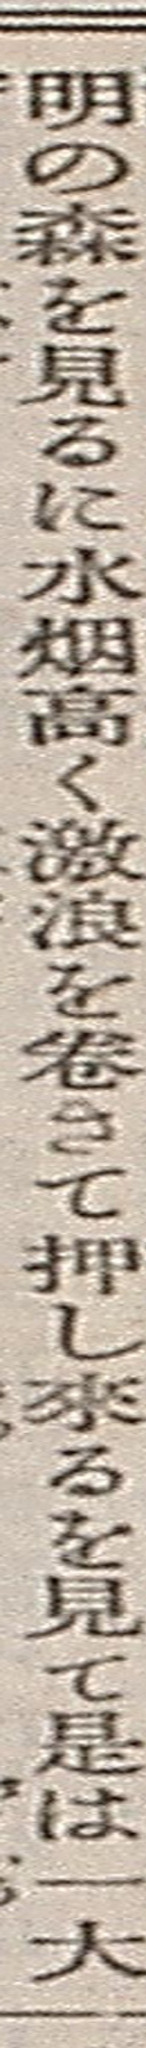明の森を見るに水烟高く激浪を巻きて押し来るを見て是は一大
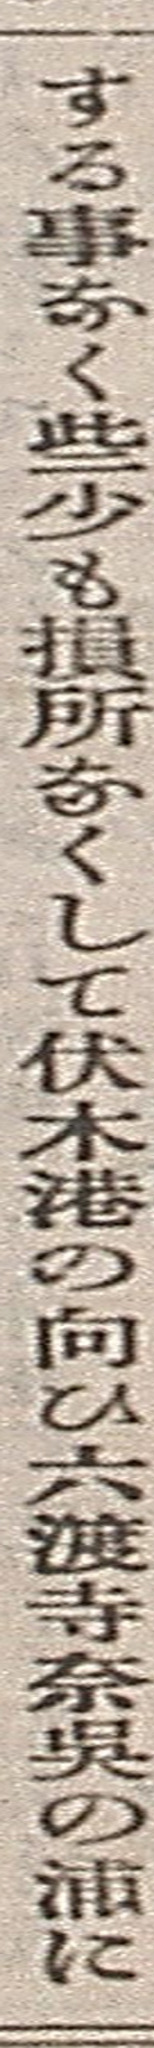する事なく些少も損所なくして伏木港の向ひ六渡寺奈呉の浦に
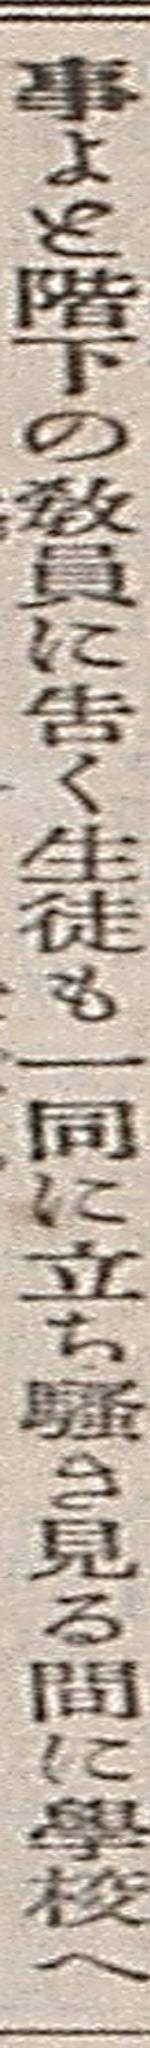事よと階下の教員に告く生徒も一同に立ち騒ぎ見る間に学校へ
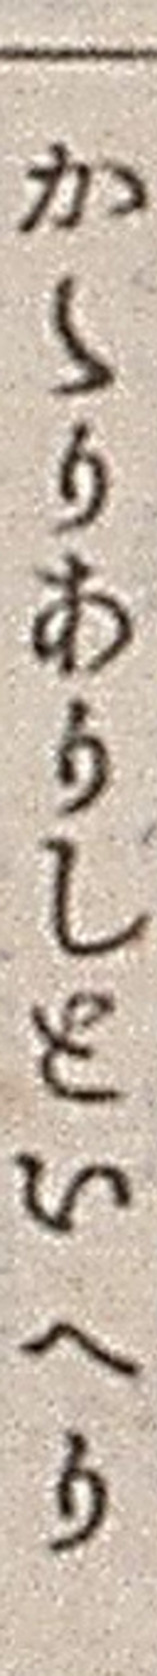かゝりありしといへり
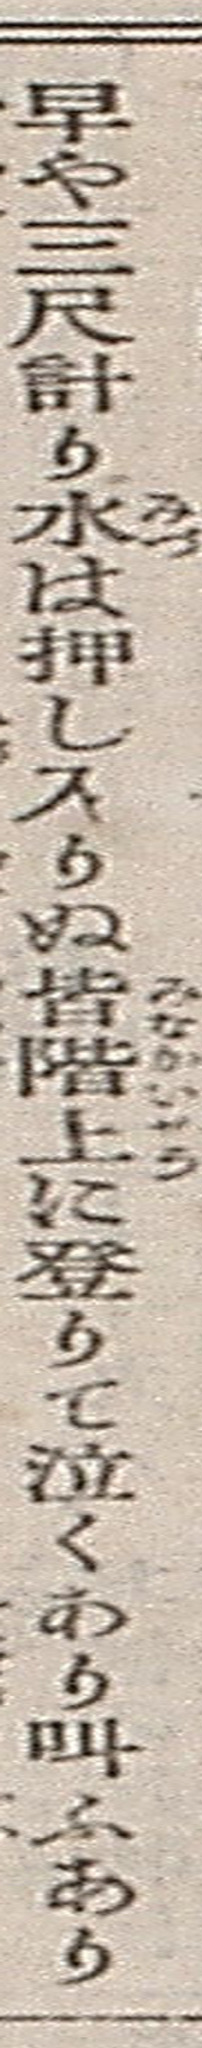早や三尺計り水は押し入りぬ皆階上に昇りて泣くあり叫ぶあり
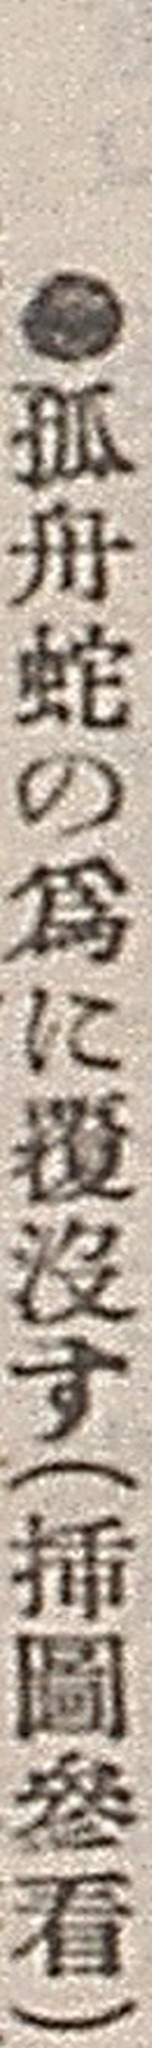●孤舟蛇の為に覆没す
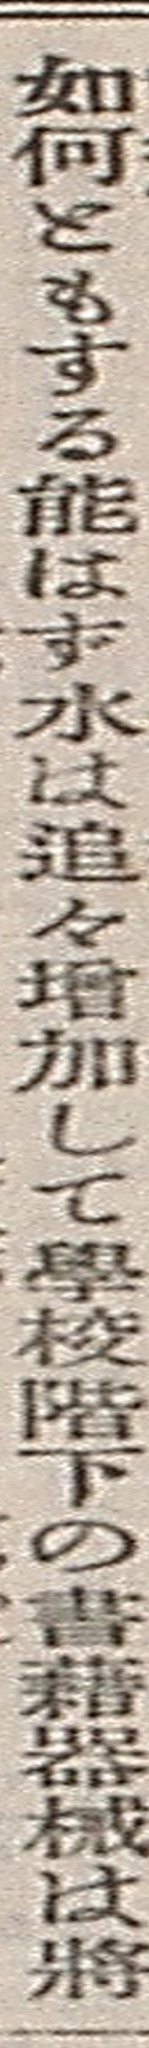如何ともする能はず水は追々増加して学校階下の書籍器械は将
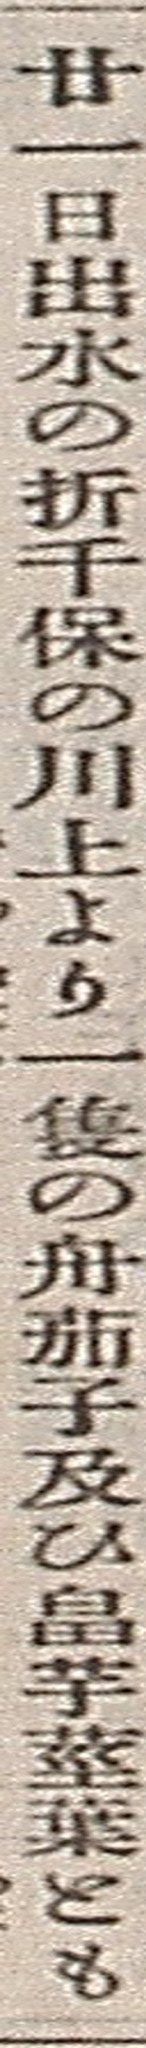廿一日出水の折千保の川上より一隻の舟茄子及び畠芋茎葉とも
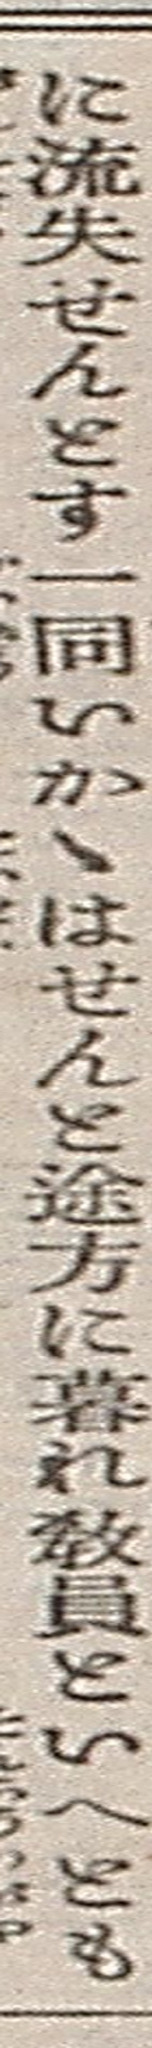に流失せんとす一同いかゝはせんと途方に暮れ教員といはとも
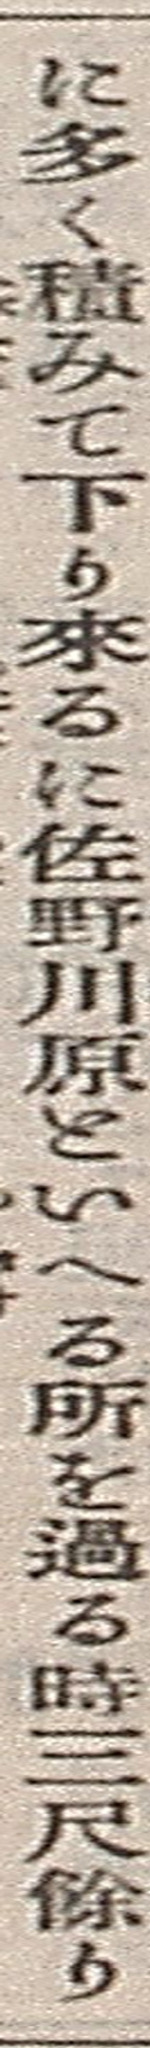に多く積みて下り来るに佐野川原といへる所を過る時三尺餘り
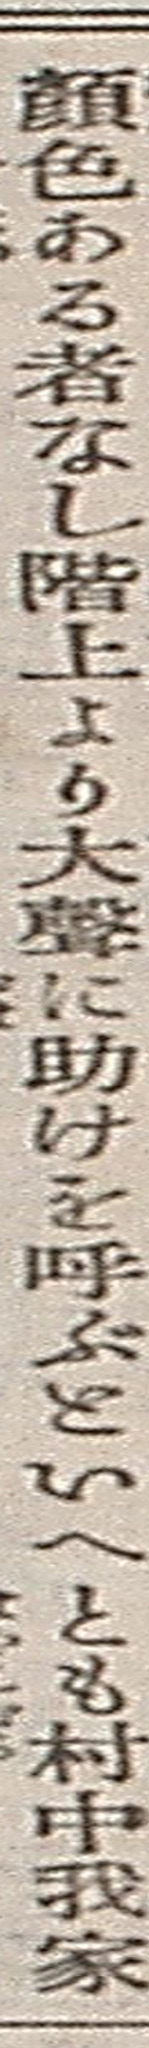顔色ある者なし階上より大声に助けを呼ぶといへども村中我家
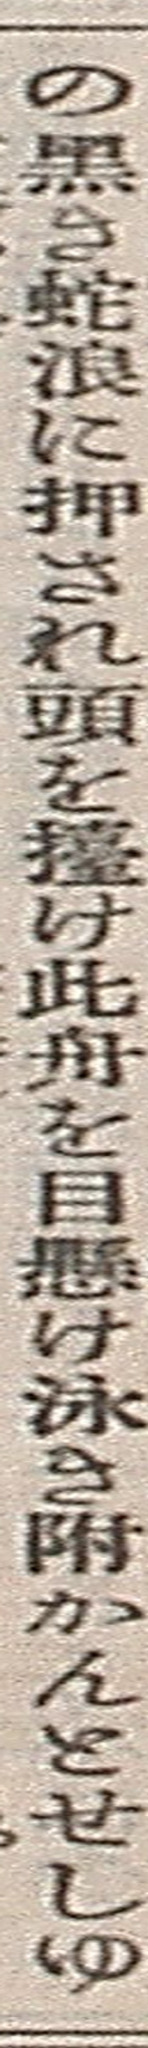の黒き蛇浪に押され頭を擡げ此舟を目懸け泳ぎ附かんとせしゆ
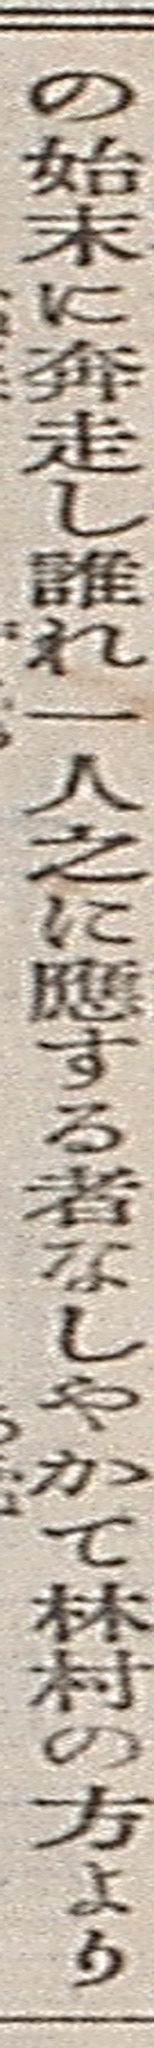の始末に奔走し誰れ一人之に応ずる者なしやかて林村の方より
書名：風俗畫報臨時増刊第百二十八號　洪水被害録（下）
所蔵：東京大学地震研究所図書室 Earthquake Research Institute Library, The University of Tokyo, JAPAN
